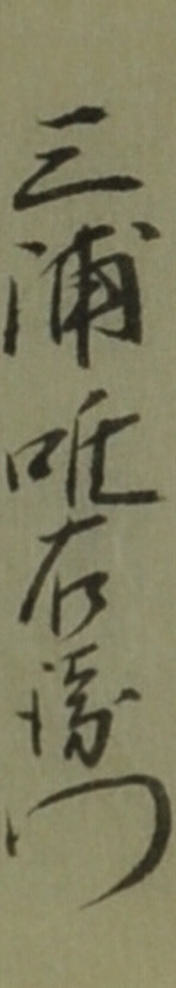三浦唯右衛門
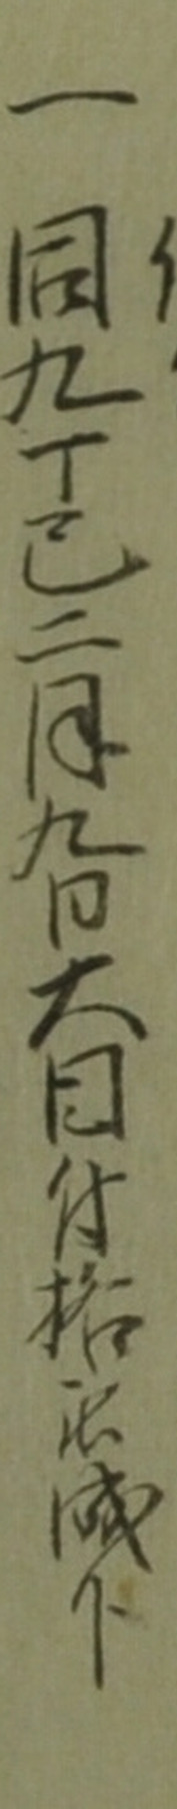一同九丁巳二月九日大目付格被成下
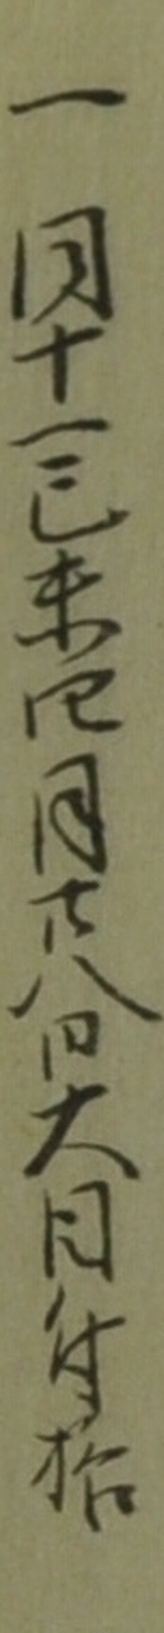一同十一己未四月廿八日大目付格
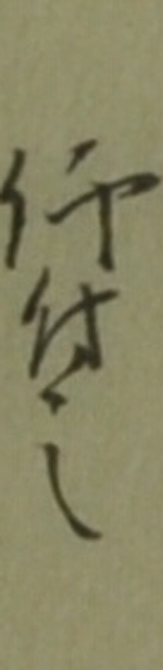仰付之
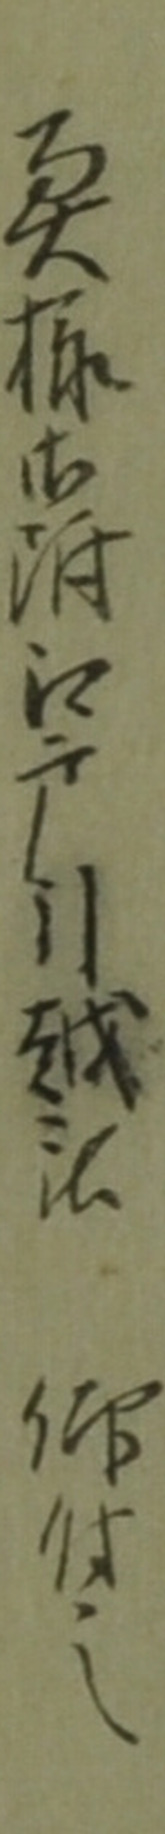奥様御附江戸引越被仰付之
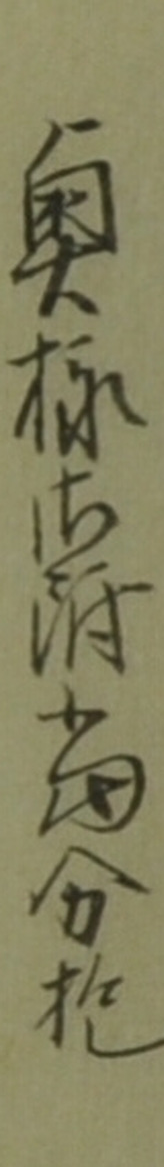奥様御附当分抱
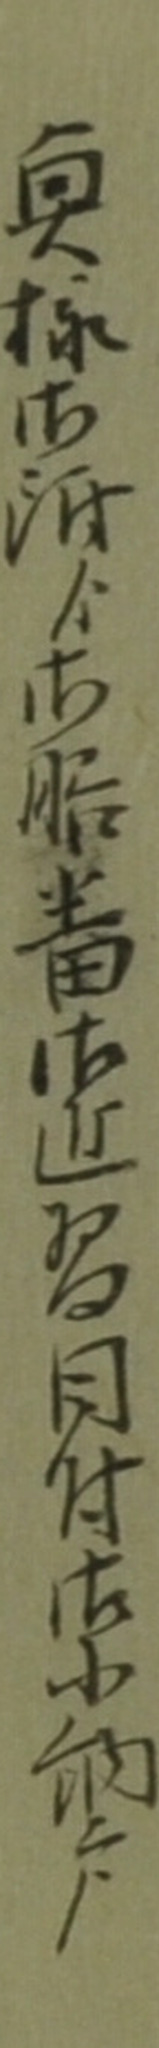奥様御附ゟ御膳番御近習目付御小納戸
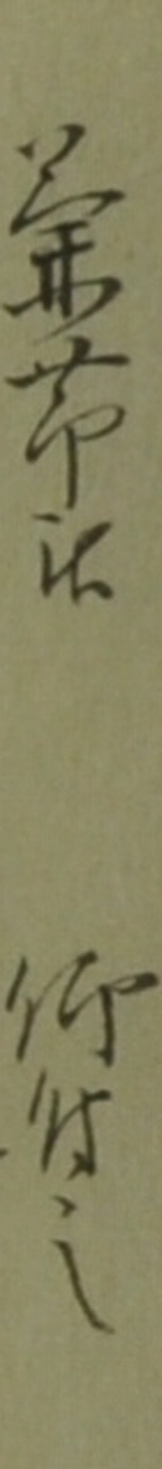兼帯被仰付之
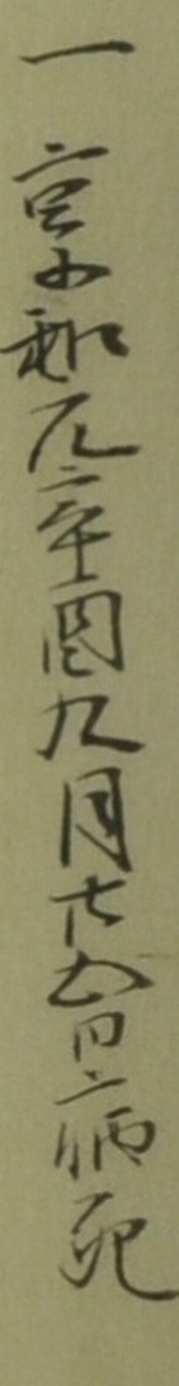一享和元辛酉九月廿五日病死

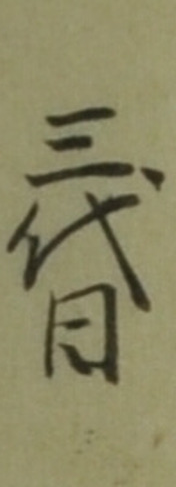三代目
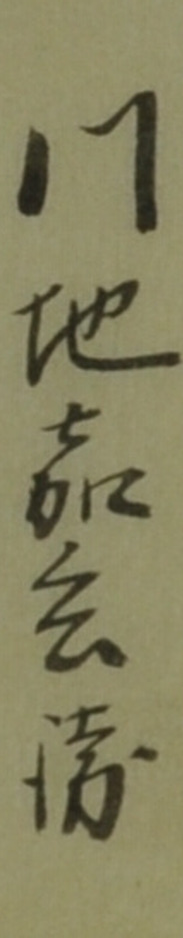川地嘉兵衛
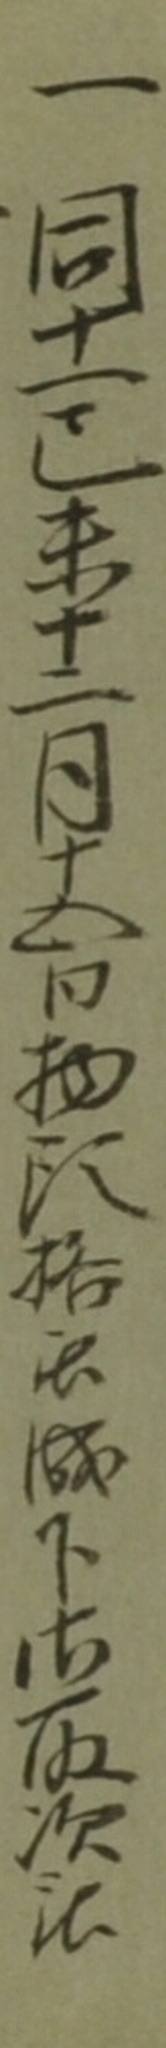一同十一己未十二月十五日物頭格被成下御取次被
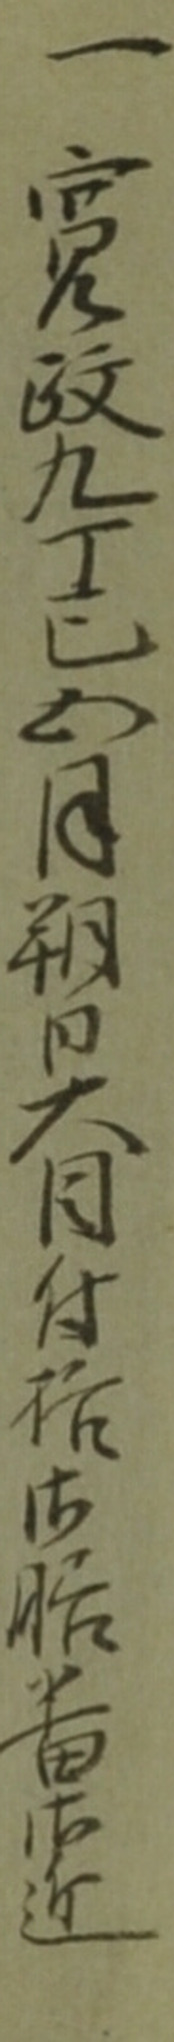一寛政九丁巳五月朔日大目付格御膳番御近
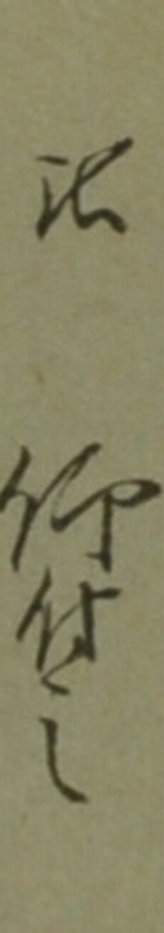被仰付之
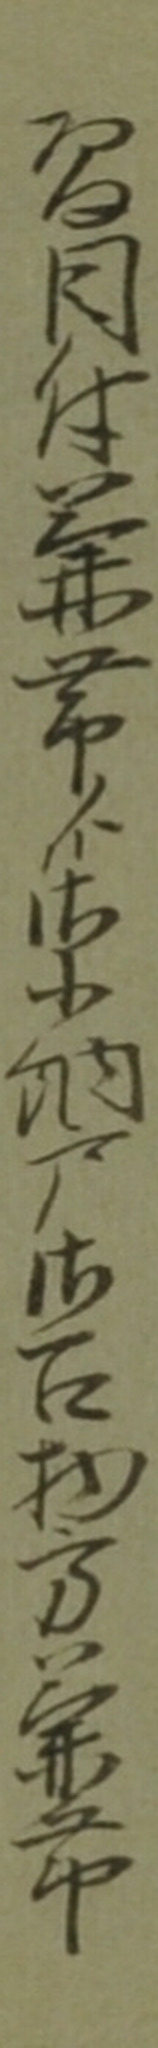習目付兼帯ゟ御小納戸御召物方兼帯
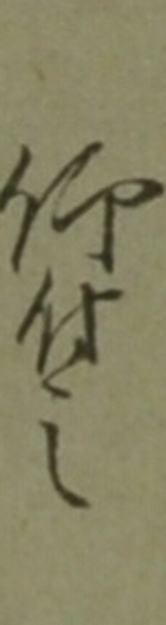仰付之
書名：諸御役代々録（四）
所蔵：伊那市立高遠町図書館・合同会社AMANE
